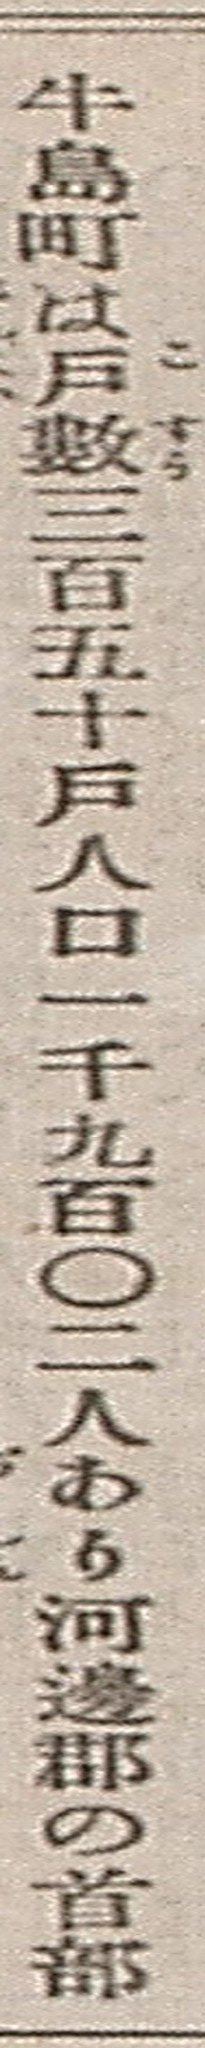牛島町は戸数三百五十戸人口一千九百〇二人あり河辺郡の首部
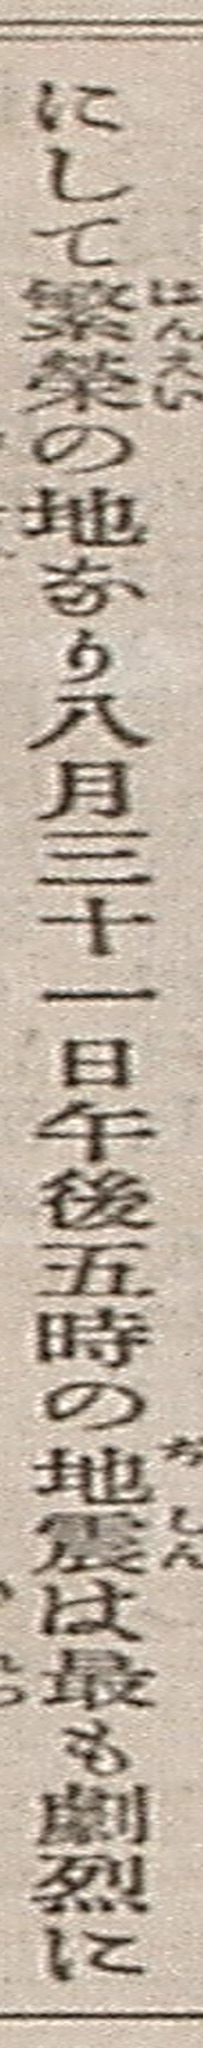にして繁栄の地なり八月三十一日午後五時の地震は最も劇烈に
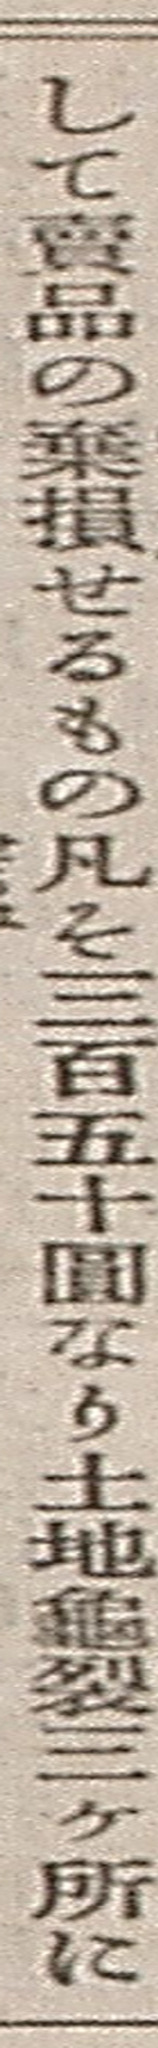して売品の棄損せるもの凡そ三百五十円なり土地亀裂三ヶ所に
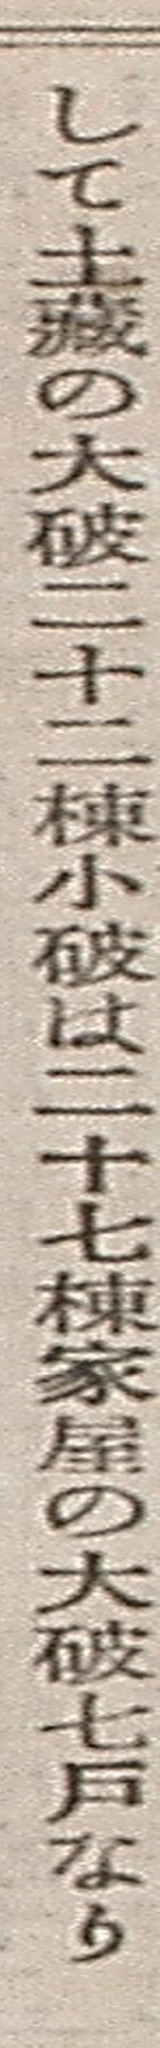して土蔵の大破二十二棟小破は二十七棟家屋の大破七戸なり
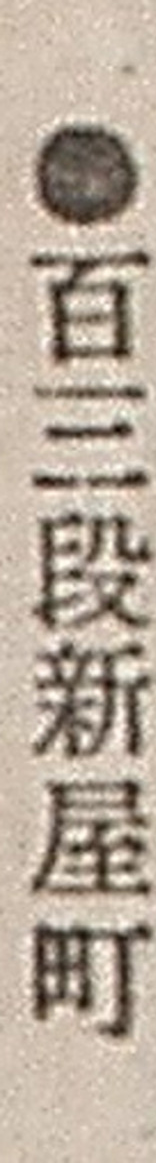●百三段新屋町
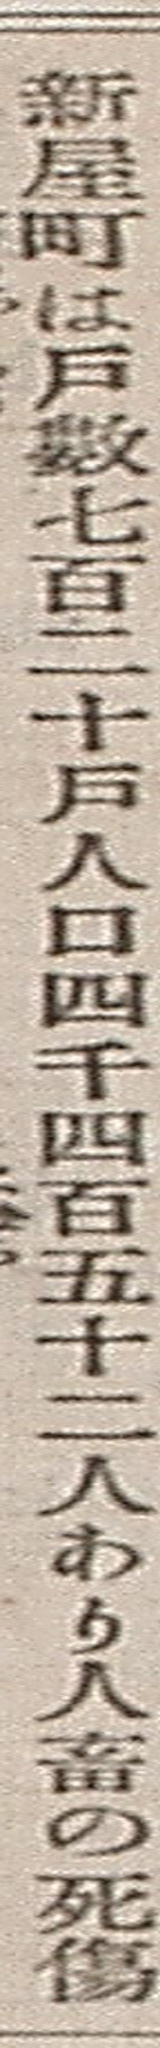新屋町は戸数七百二十戸人口四千四百五十二人あり人畜の死傷
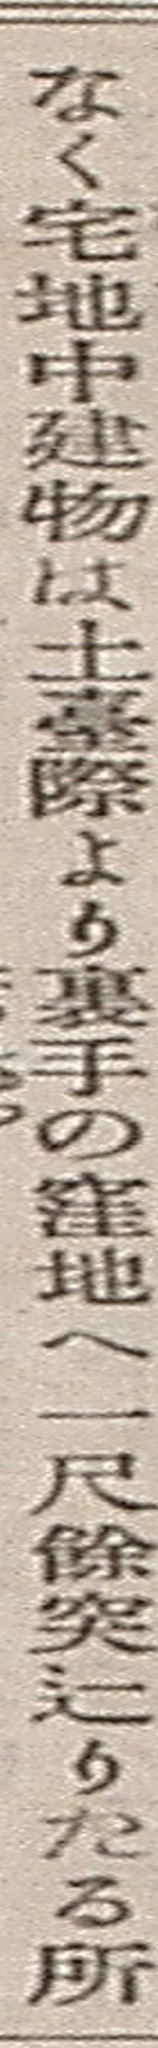なく宅地中建物は土台際より裏手の窪地へ一尺余突辷りたる所
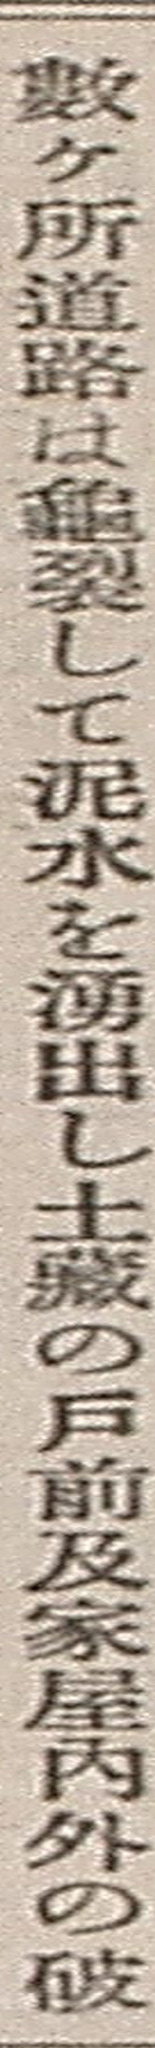数ケ所道路は亀裂して泥水を湧出し土蔵の戸前及家屋内外の破
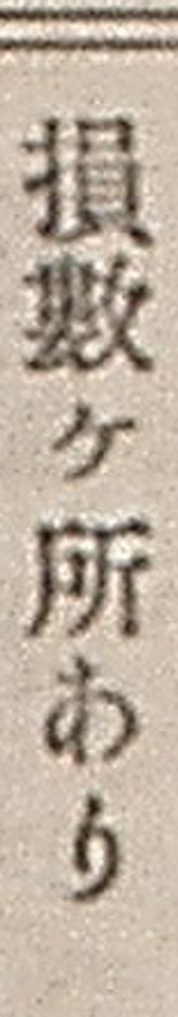損数ケ所あり歇
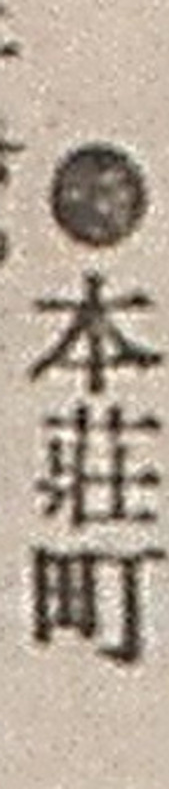●本荘町
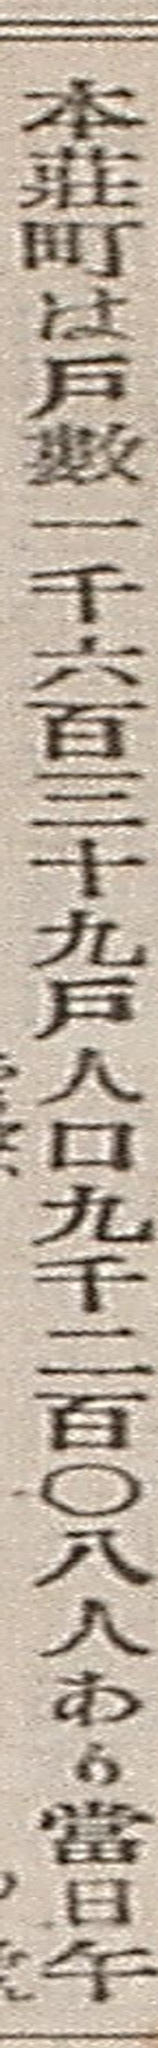本荘町は戸数一千六百三十九戸人口九千二百〇八人あり当日午
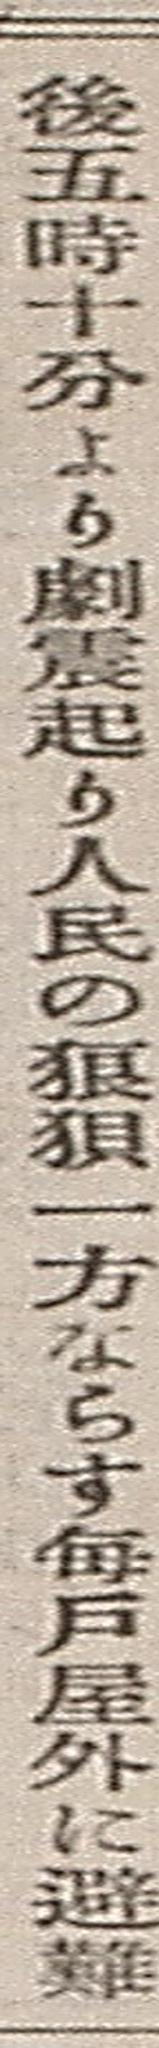後五時十分より劇震起り人民の狼狽一方ならす毎戸屋外に避難
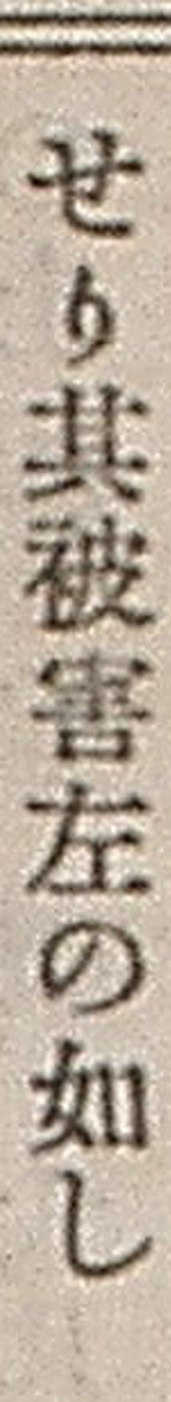せり其被害左の如し
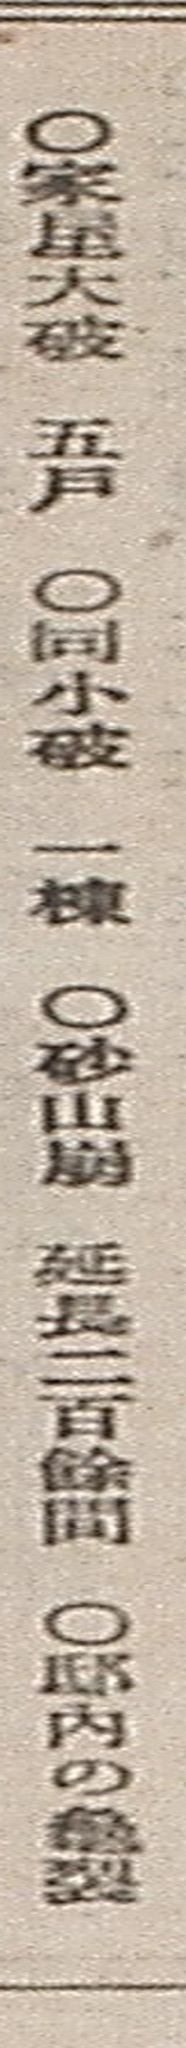〇家屋大破五戸〇同小破一棟〇砂山崩延長二百余間〇邸内の亀裂
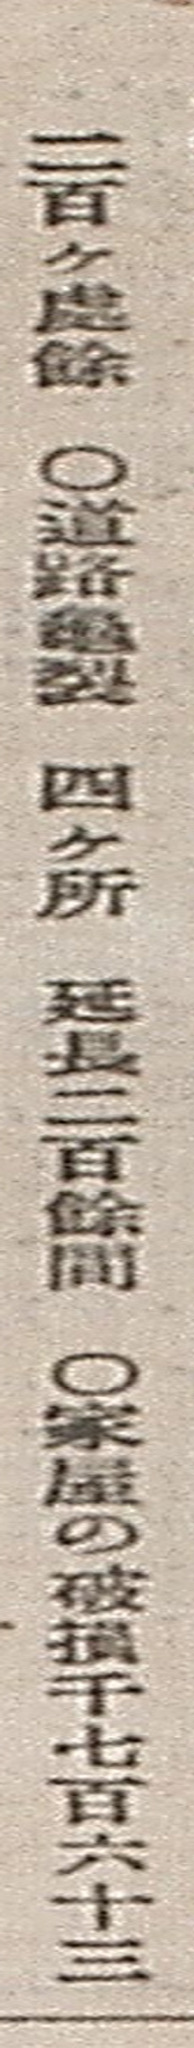二百ケ処余〇道路亀裂四ケ所延長二百余間〇家屋の破損千七百六十三
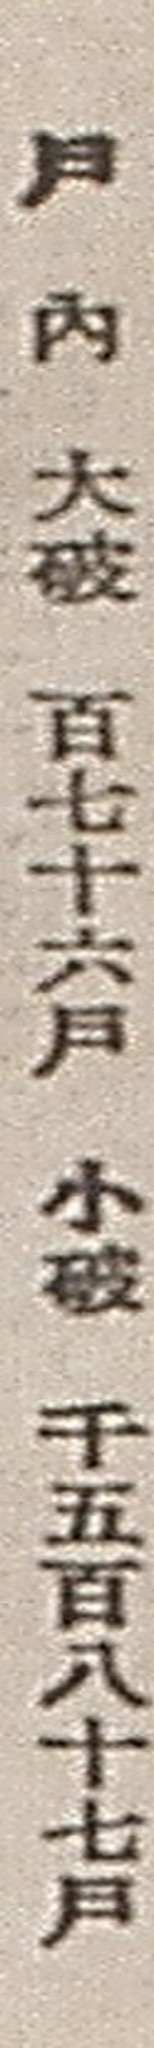戸内大破百七十六戸小破千五百八十七戸
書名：風俗畫報臨時増刊第百二十四號　洪水地震被害録（上）
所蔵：東京大学地震研究所図書室 Earthquake Research Institute Library, The University of Tokyo, JAPAN
